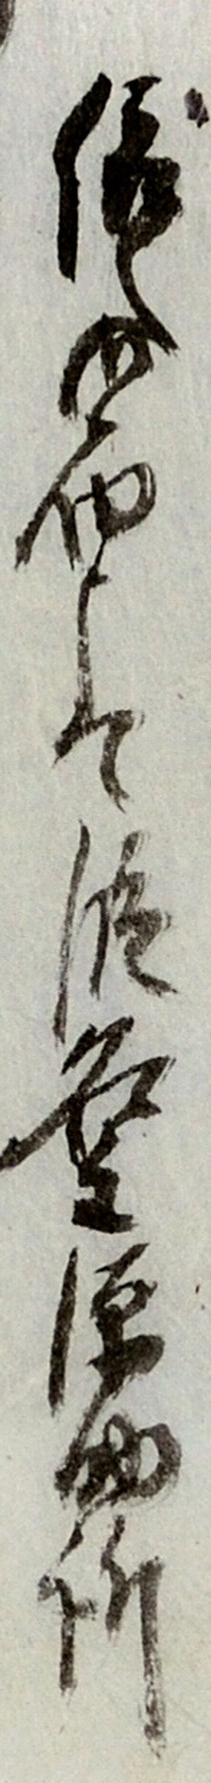依之御届申上候段名主源助訴
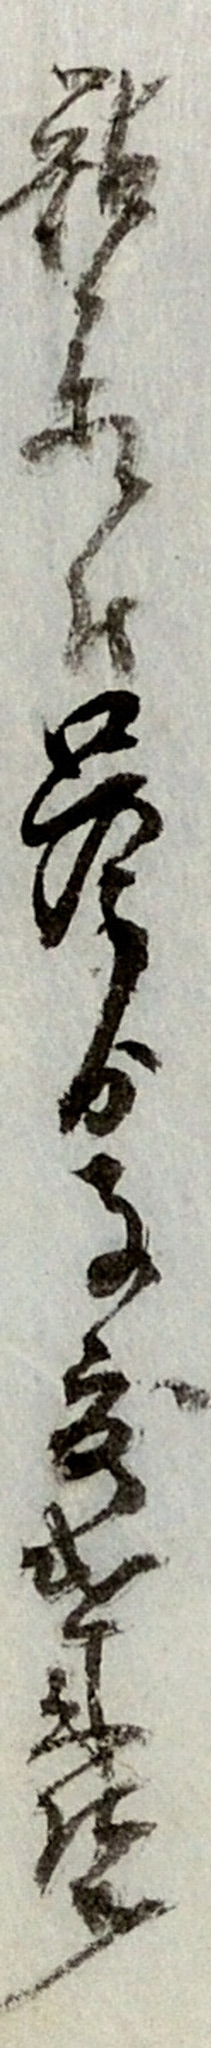鮎参ニ付只今ゟ支度遣来仕候
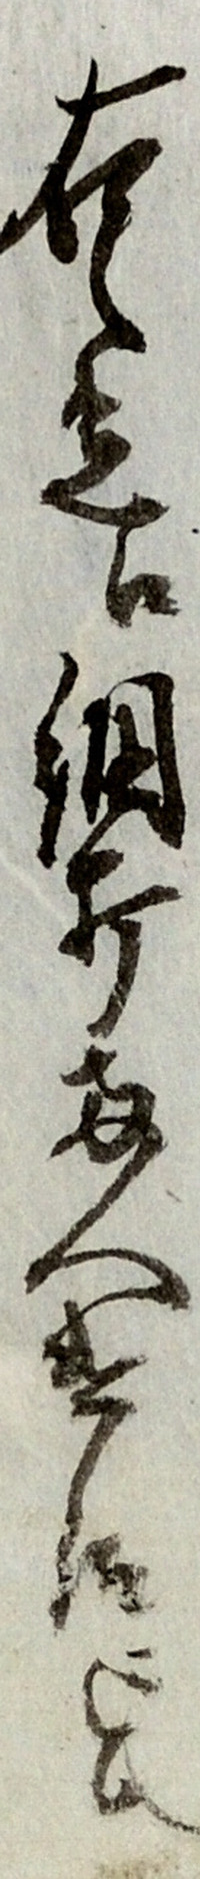右之辺江網打両人遣様ニと
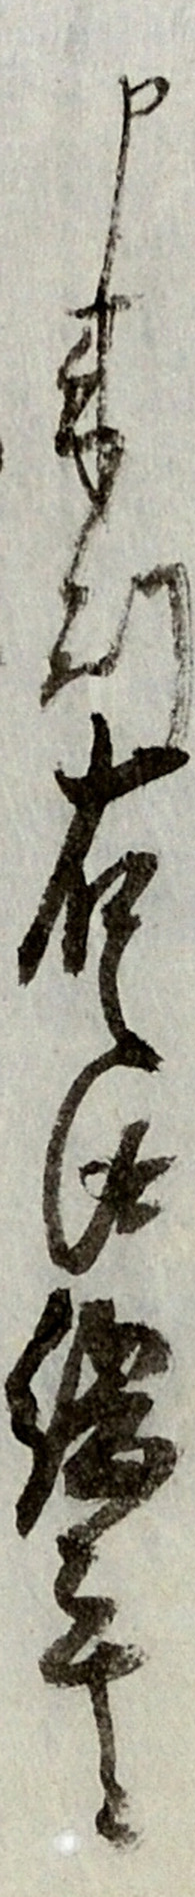申来則右之趣綱平ニ
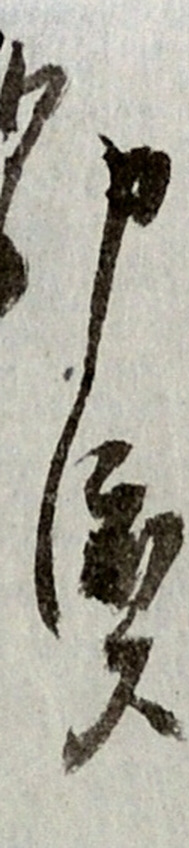申渡す
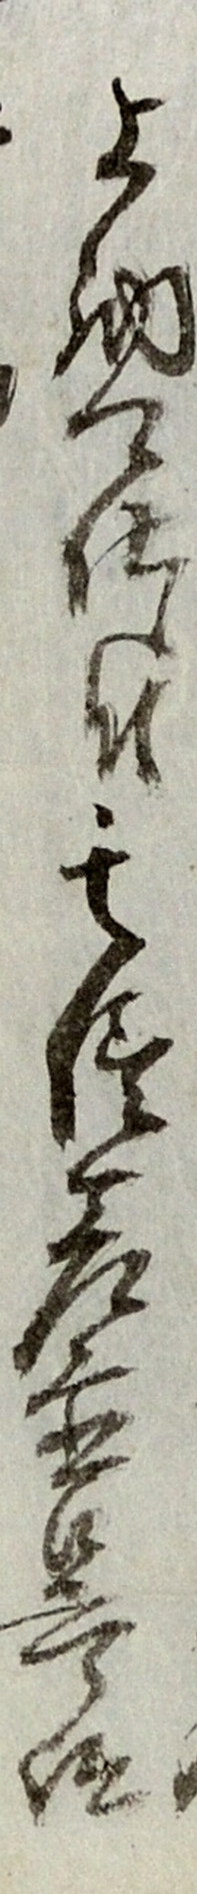上納可仕候付其侭差置呉候様

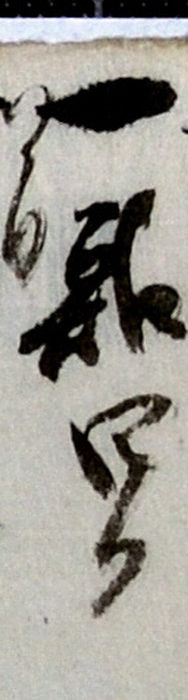一鮎四つ
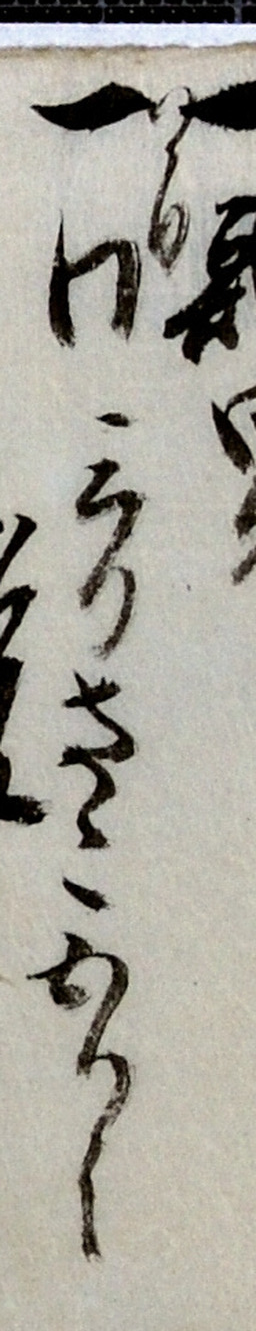一同三つさこ五つ綱平
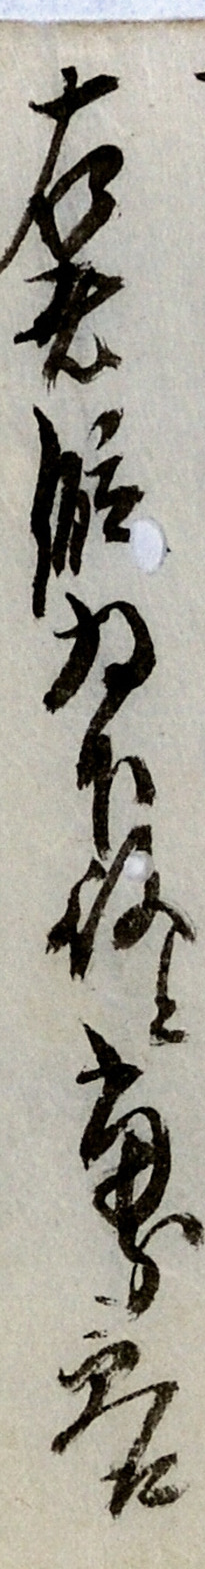右は仮為下役に当分受取
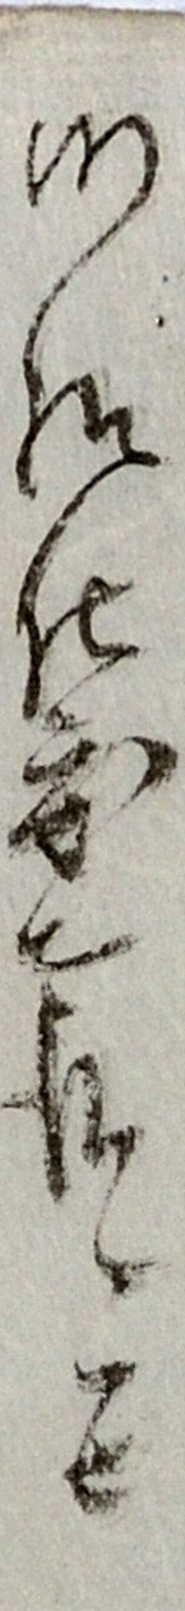何様仕度奉存候以上
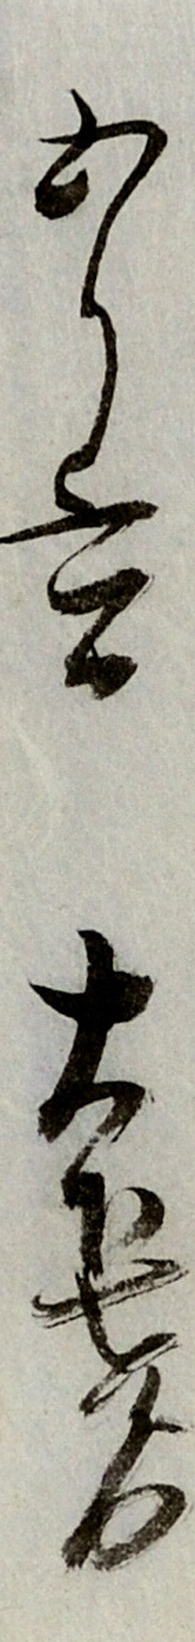五月六日大下七左衛門
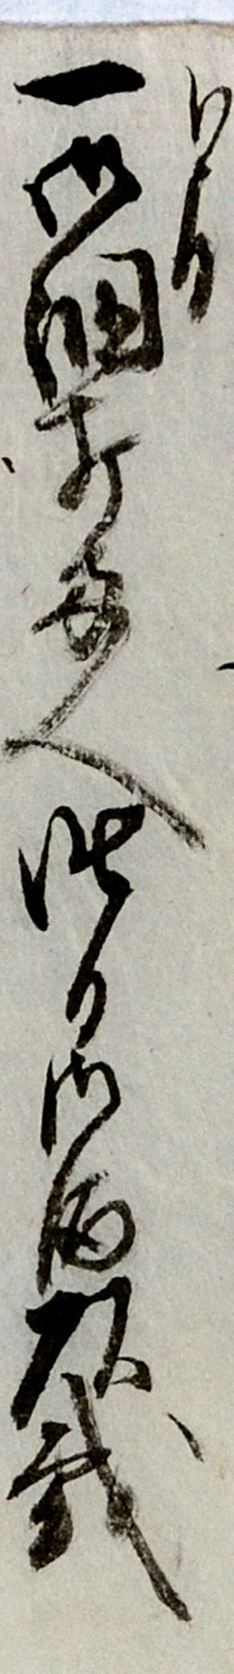一御網打両人昨日御酒頂戴
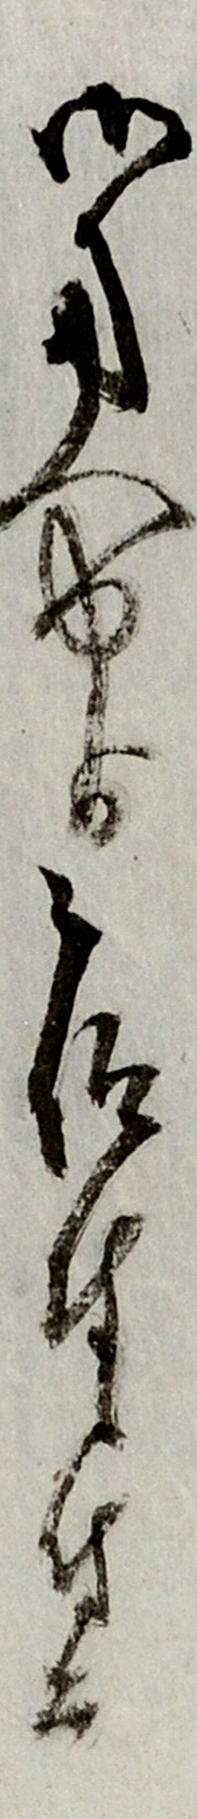御用人中ゟ被仰付候は
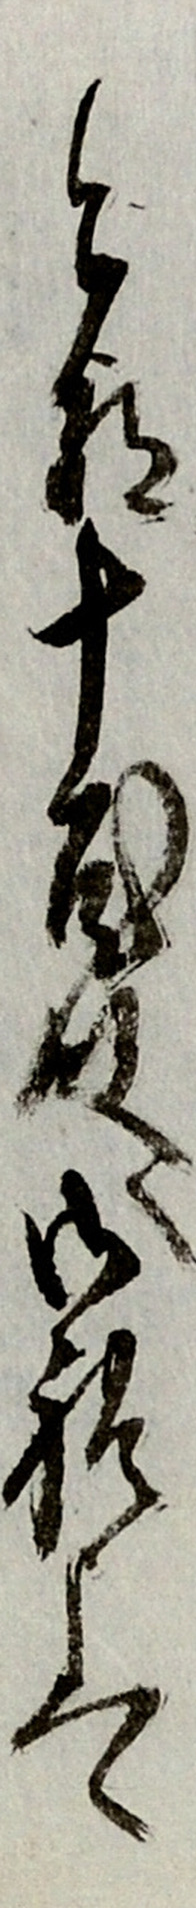今朝十蔵殿へ御礼申上候
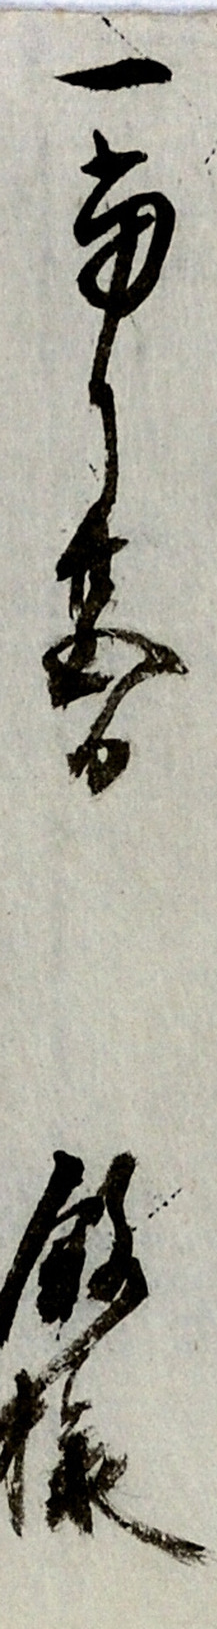一当月廿五日殿様
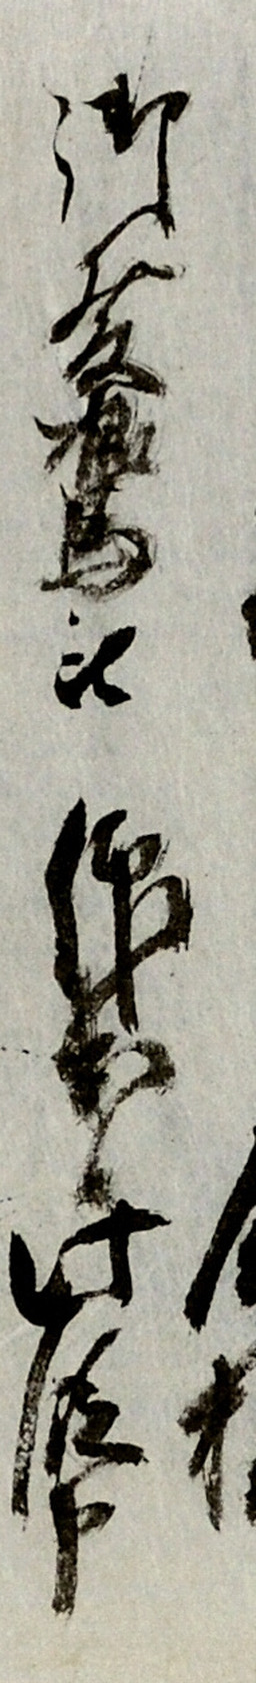御発駕被仰出候此段申
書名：分一方諸事御用留帳
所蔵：伊那市立高遠町図書館・合同会社AMANE
